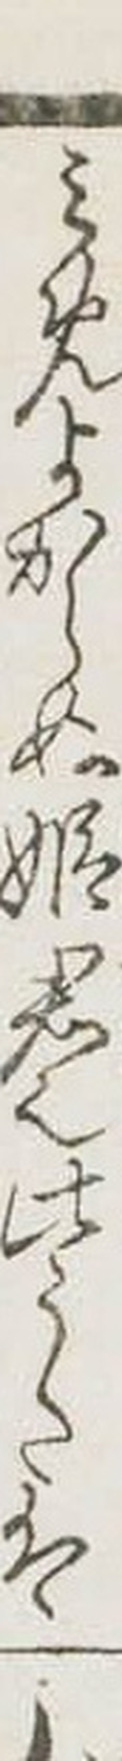みめよからぬ姫君也此うたは
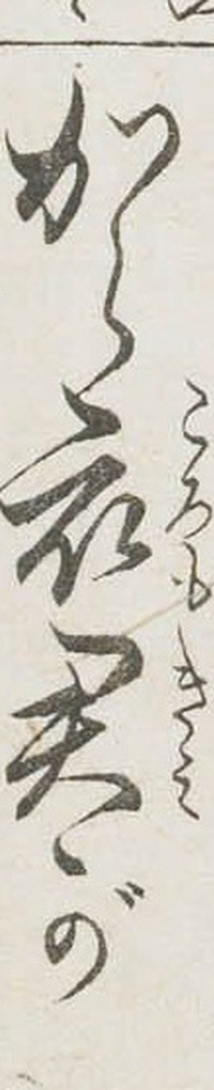から衣君が
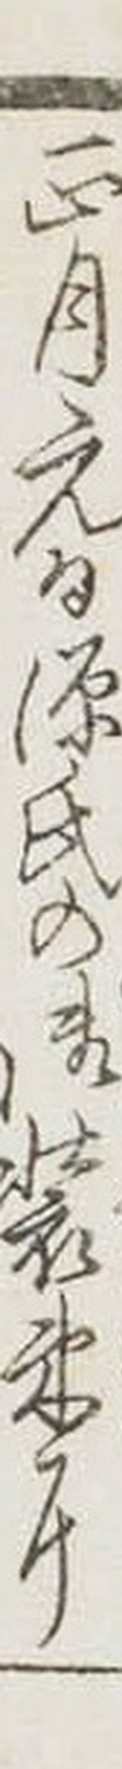正月元日源氏の御装束に
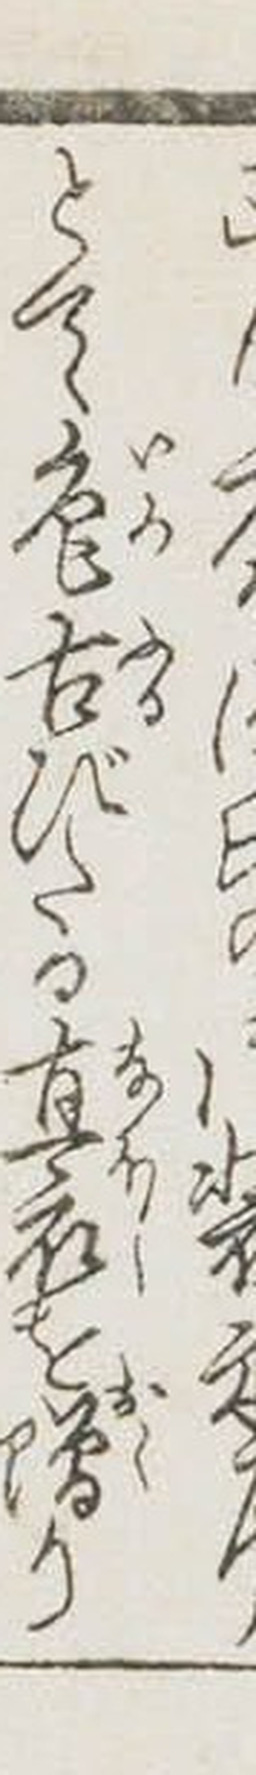とて色古びたる直衣を贈り
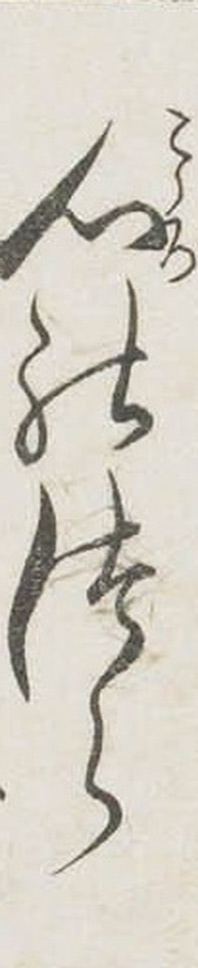心のつら
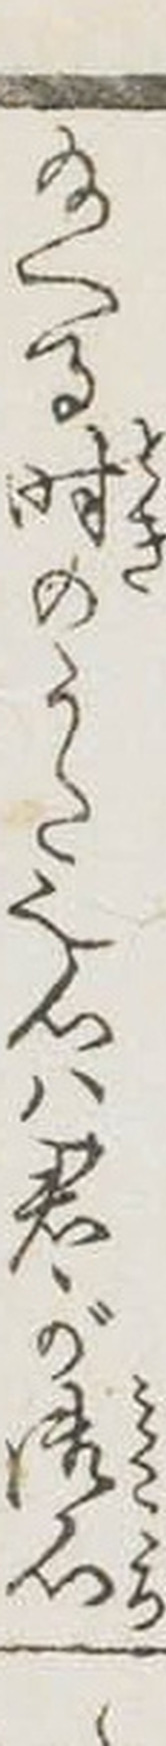給へる時のうた也心は君が御心
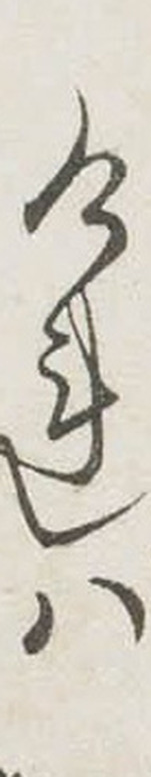ければ
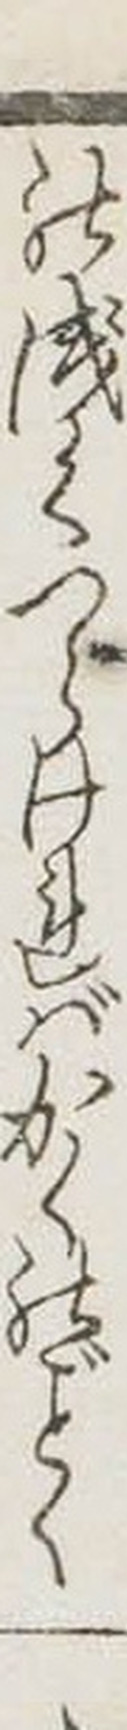の浅くつらければかくのごとく
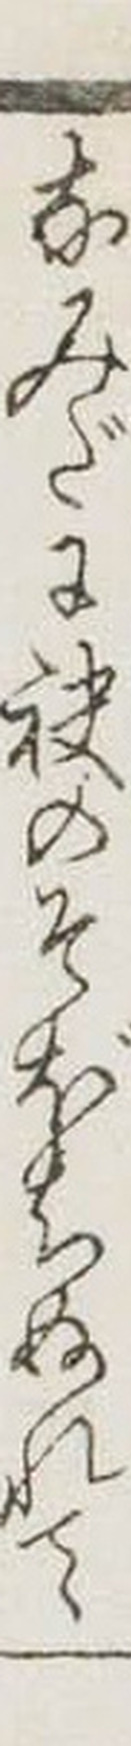なみだに袂のそぼちぬれて
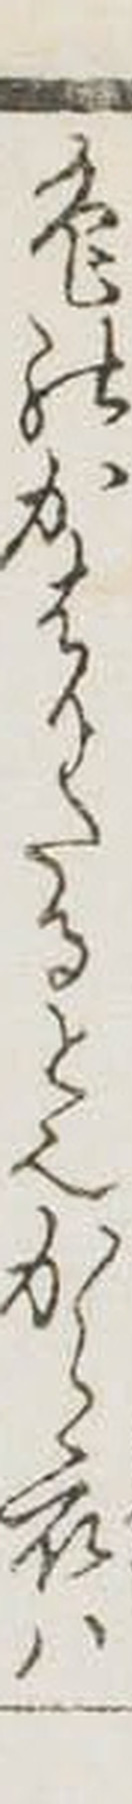色のかはりたると也から衣は
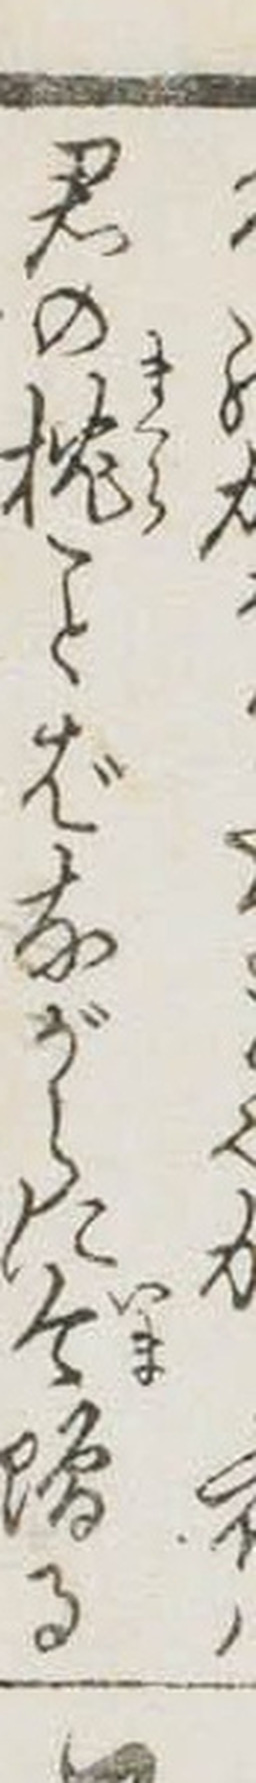君の枕ことばながらに今贈る
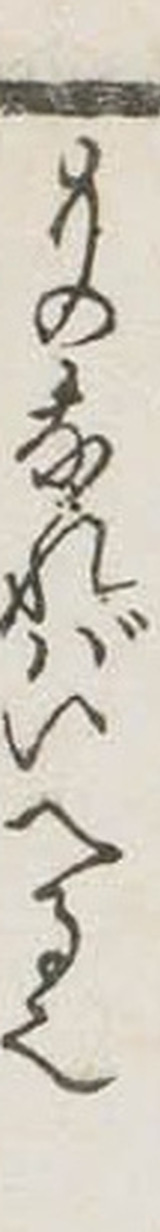ものなればいへる也

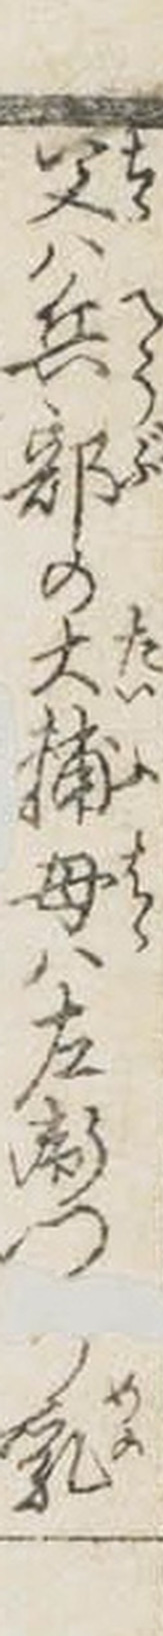父は兵部の大輔母は左衛門乳
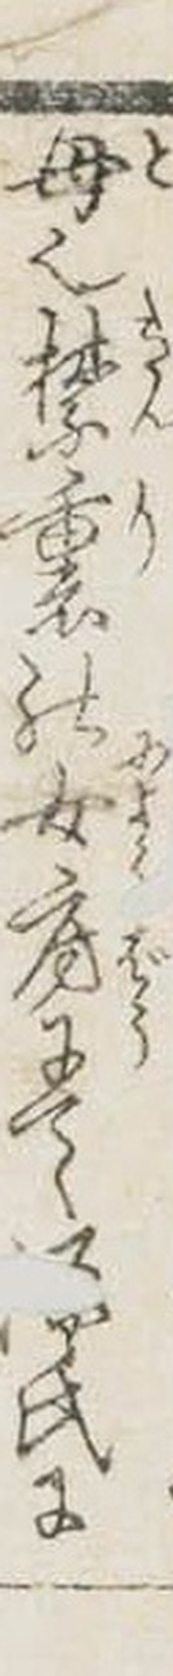母也禁裏の女房にて源氏に
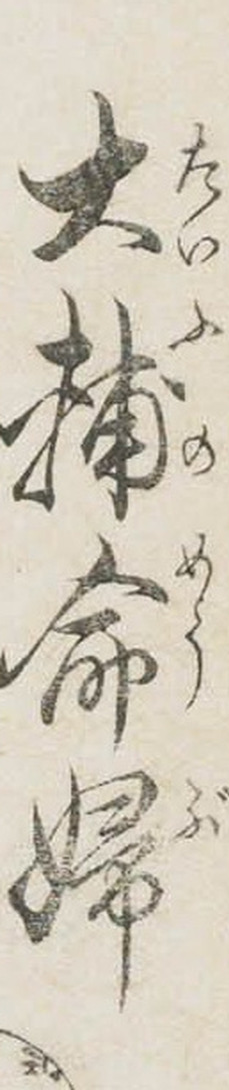大輔命婦
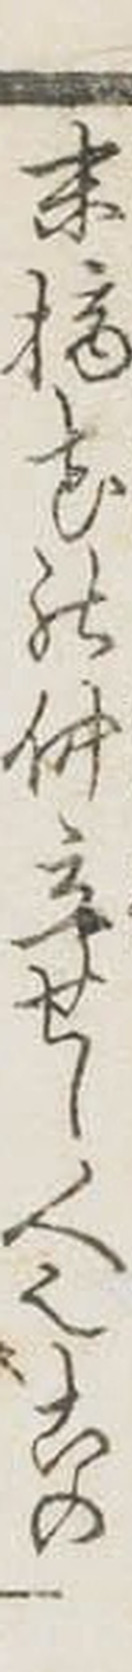末摘花の仲立せし人也この
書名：源氏百人一首
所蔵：東京学芸大学教育コンテンツアーカイブ
